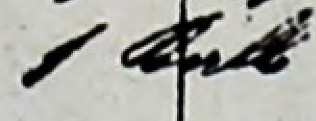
1 Kalb
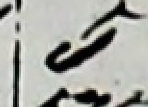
5
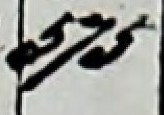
575
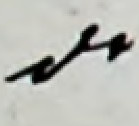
do
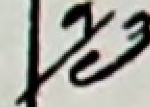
73
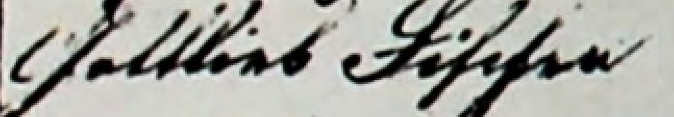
Gottlieb Fischer
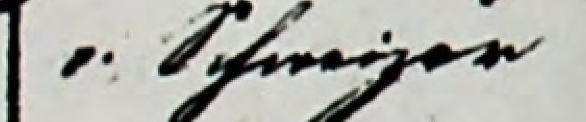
v. Schweizer
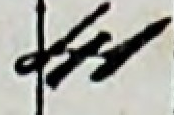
41
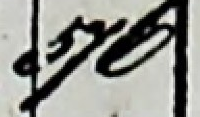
576
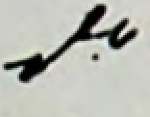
do
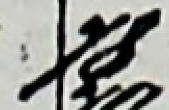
78
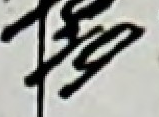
79
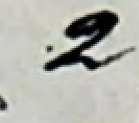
2
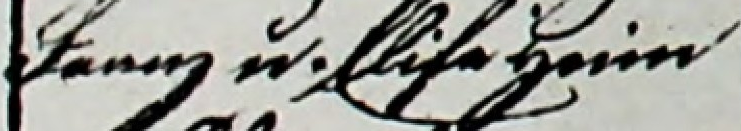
Franz u. Elise Heim
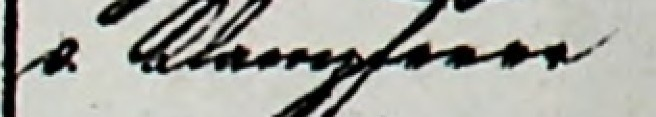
v. Klampferer
